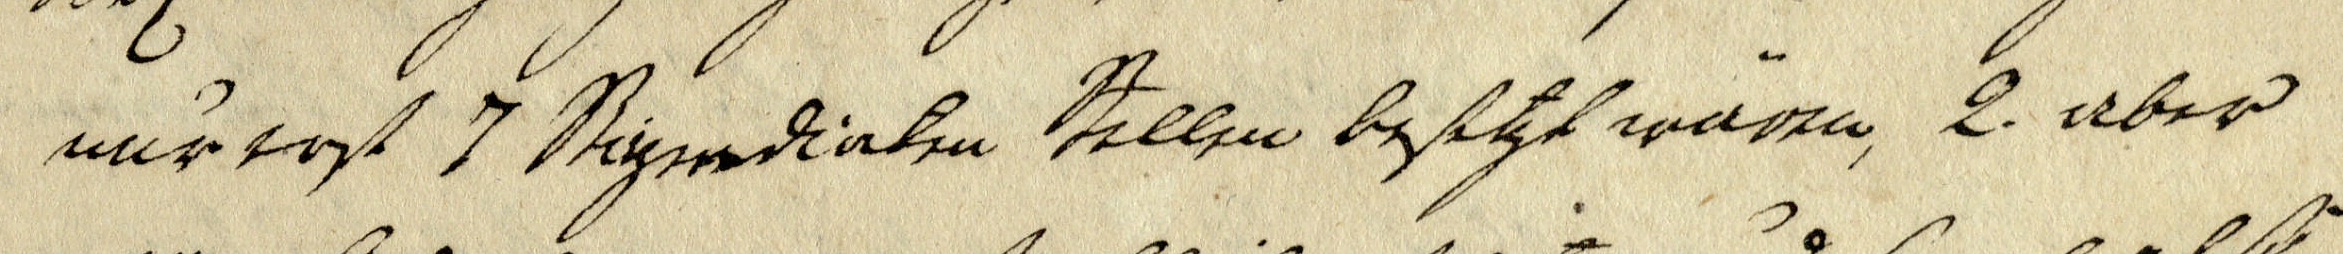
nur erst 7 Stipendiaten Stellen besetzt wären, 2. aber
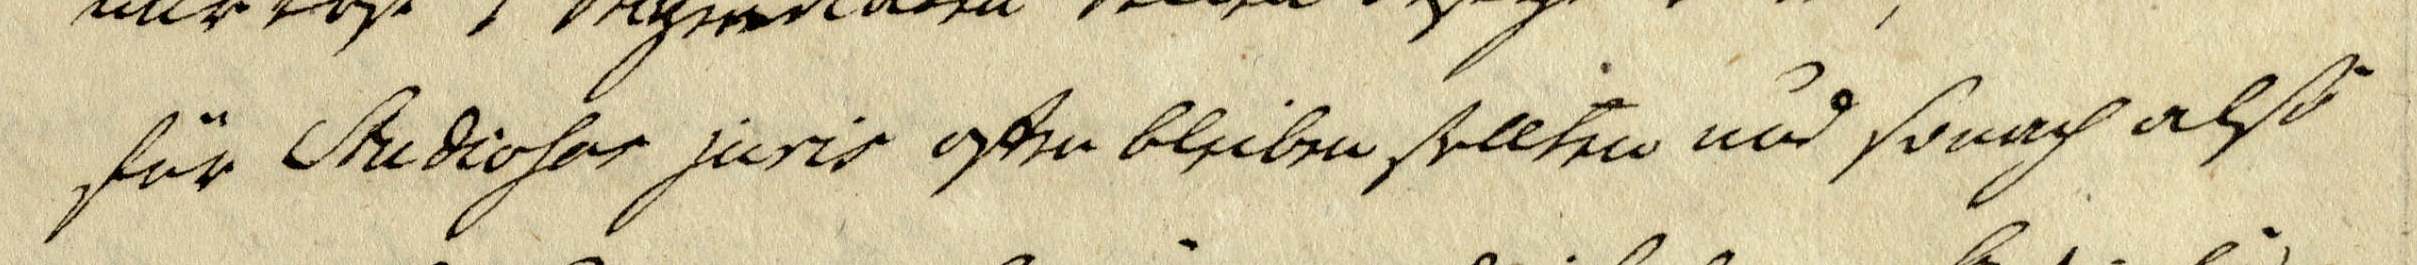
für Studiosos juris offen bleiben sollten und sonach also
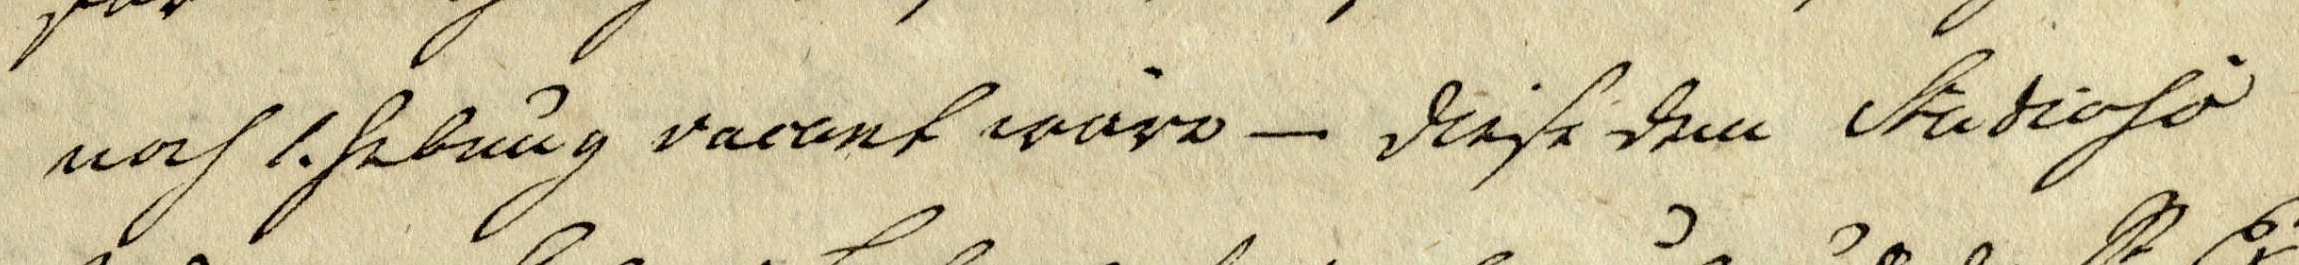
noch 1. Hebung vacant wäre - diese dem Studioso
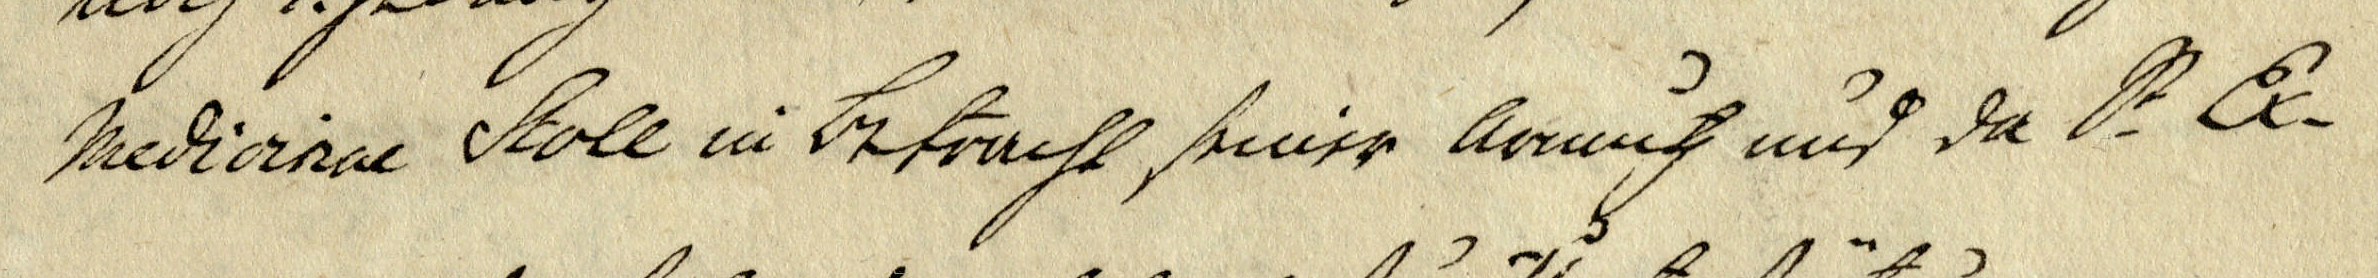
Medicinae Stoll in Betracht seiner Armuth und da Sr Ex¬
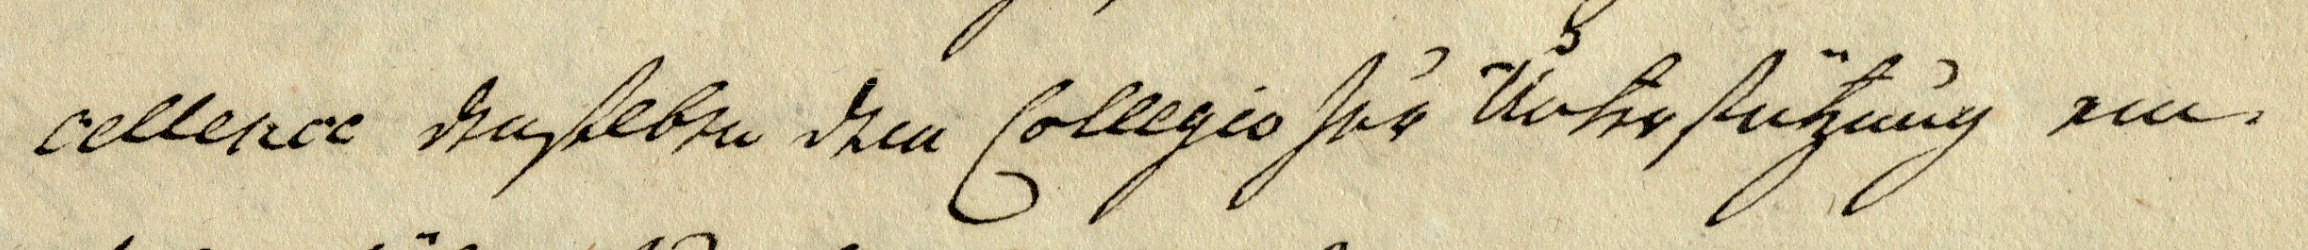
cellence denselben dem Collegio zur Unterstützung em¬
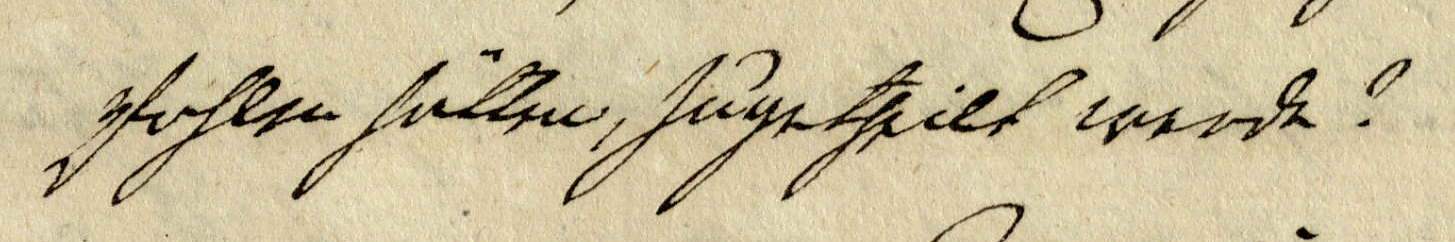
pfohlen hätten, zugetheilt werde?
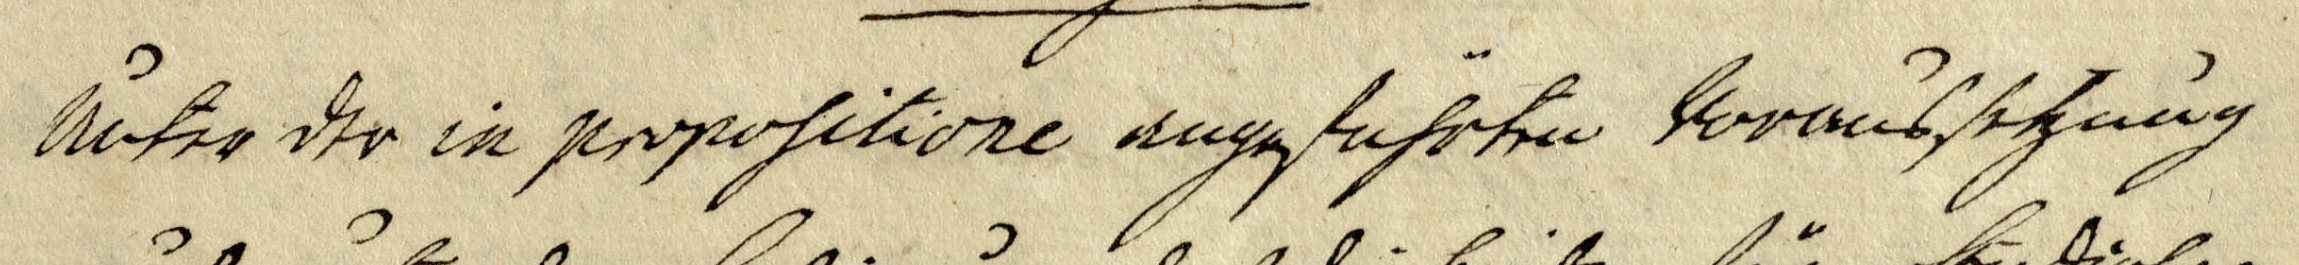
Unter der in propositione angeführten Voraussetzung
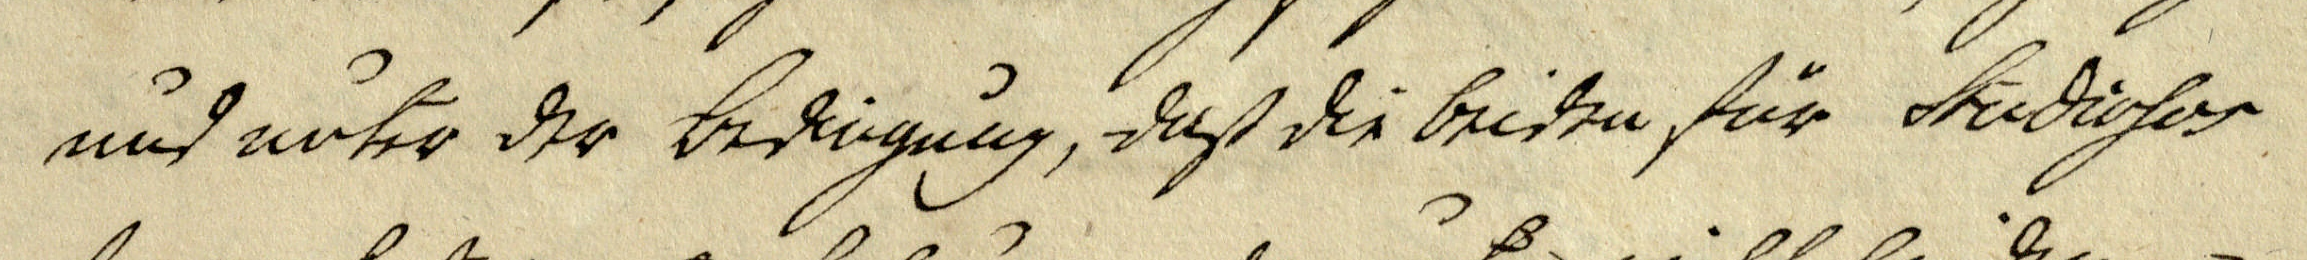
und unter der Bedingung, daß die beiden für Studiosos
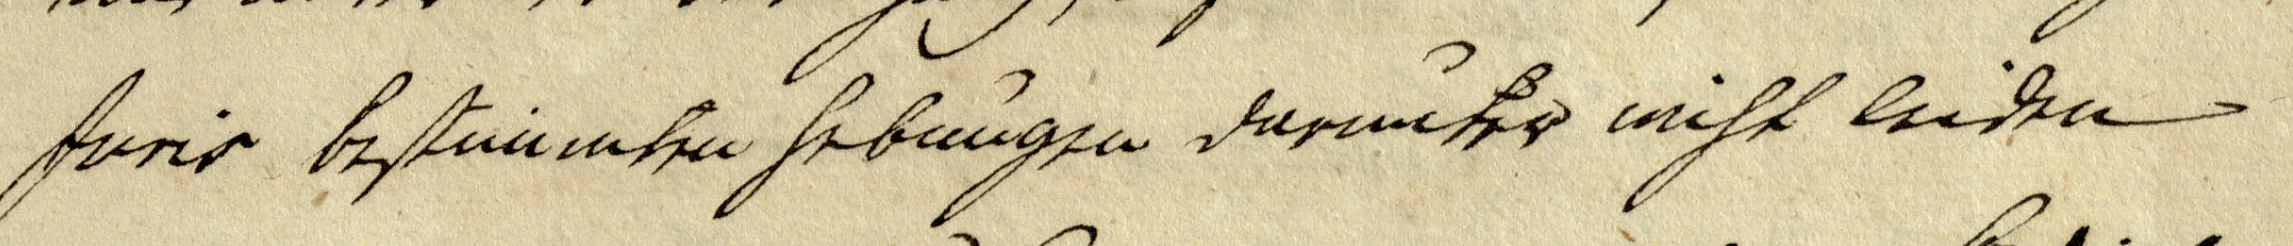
Juris bestimmten hebungen darunter nicht leiden
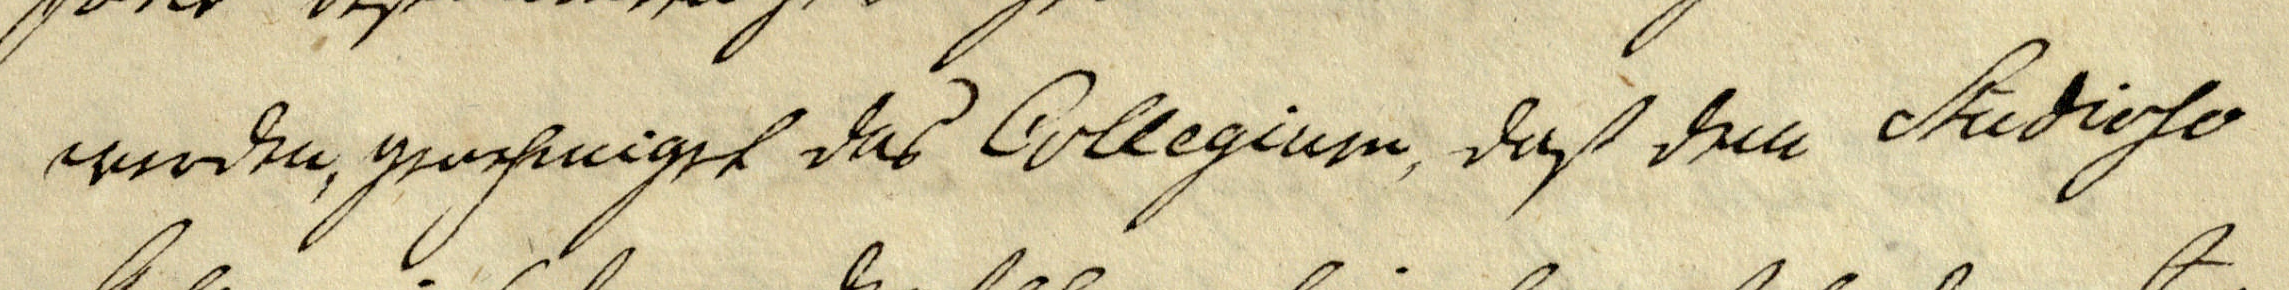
werden, genehmiget das Collegium, daß dem Studioso
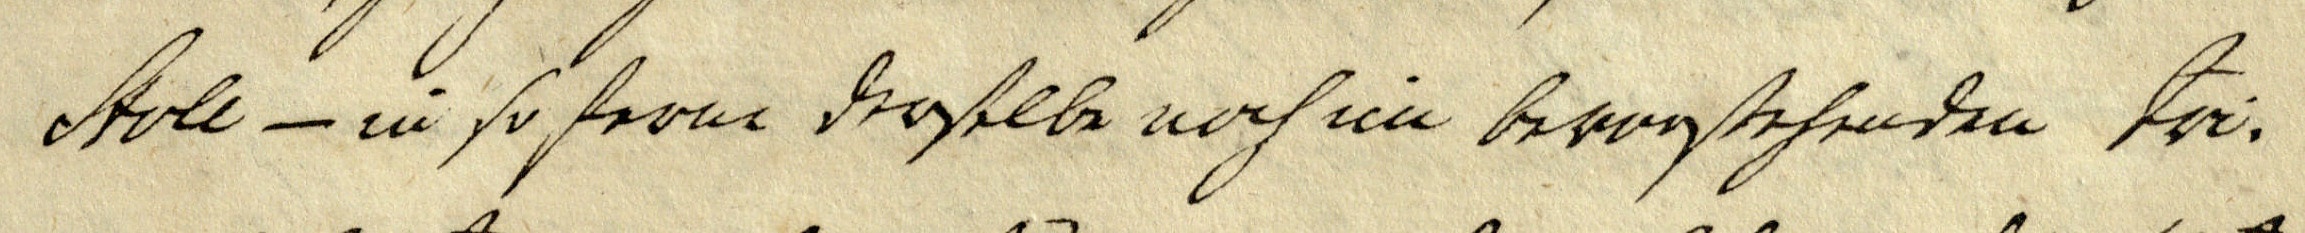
Stolle - in so ferne derselbe noch im bevorstehenden Tri¬
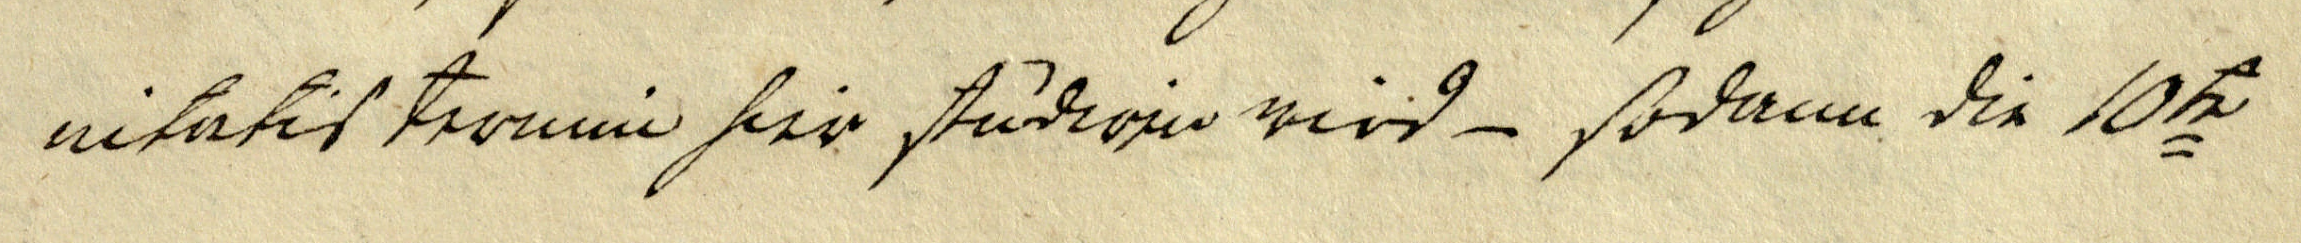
nitatis Termin hier studiren wird - sodann die 10 te
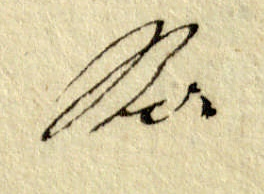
Sti
